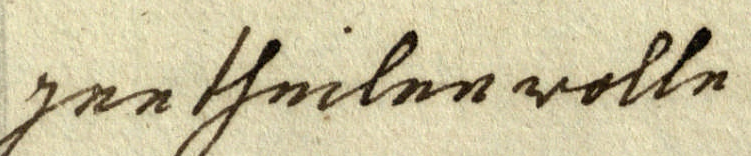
gen theilen wolle.
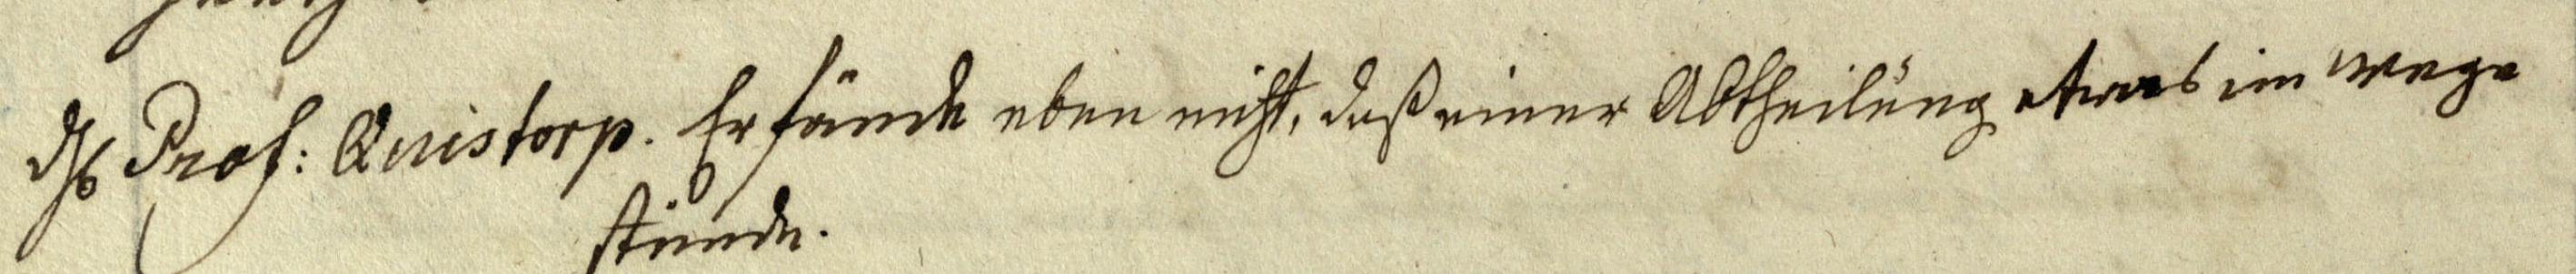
dh. Prof. Quistorp. Er fände eben nicht, daß einer Abtheilung etwas im Wege
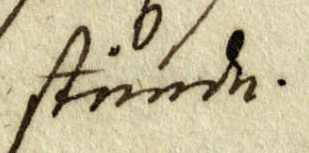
stünde.
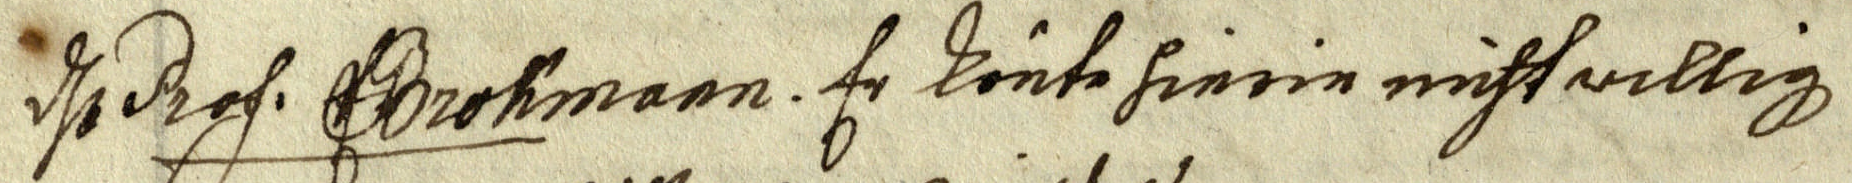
dh. Prof. Brokmann. Er könte hierin nicht willig
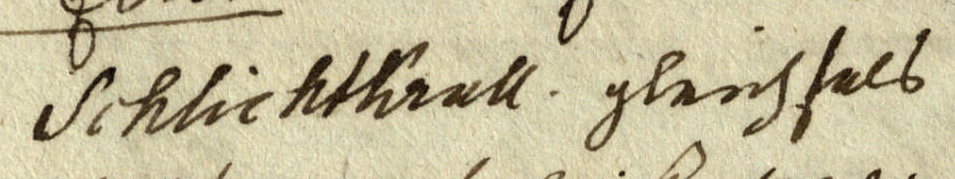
Schlichtkrull gleichfals
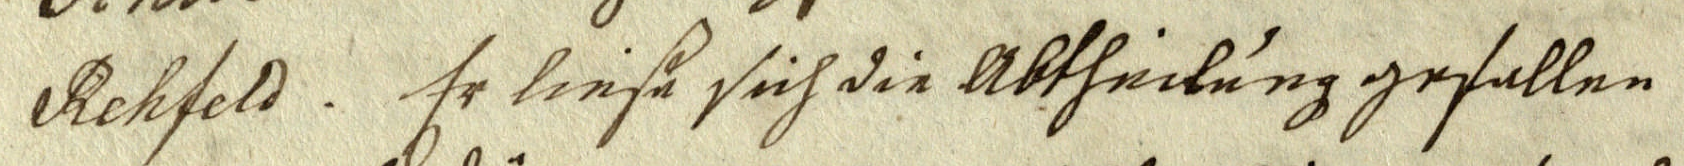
Rehfeld. Er ließe sich die Abtheilung gefallen
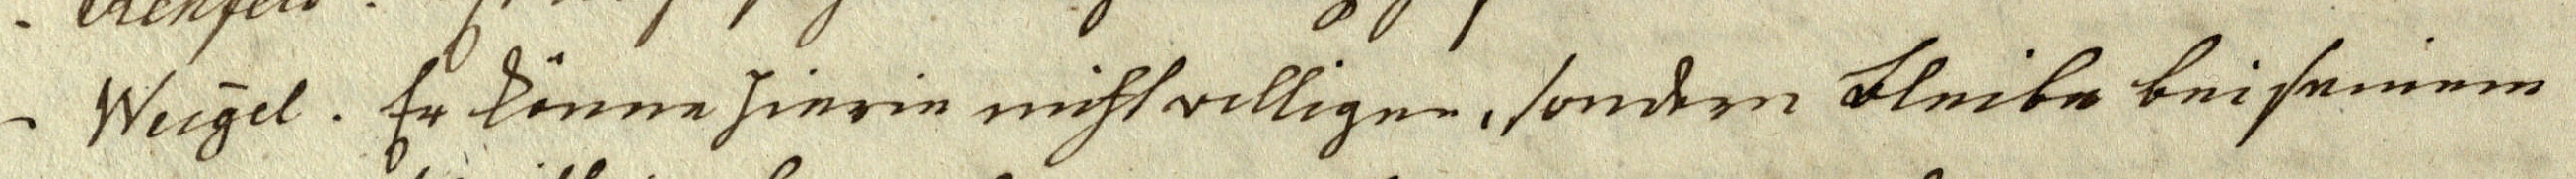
Weigel. Er könne hierin nicht willigen, sondern bleibe bei seinem
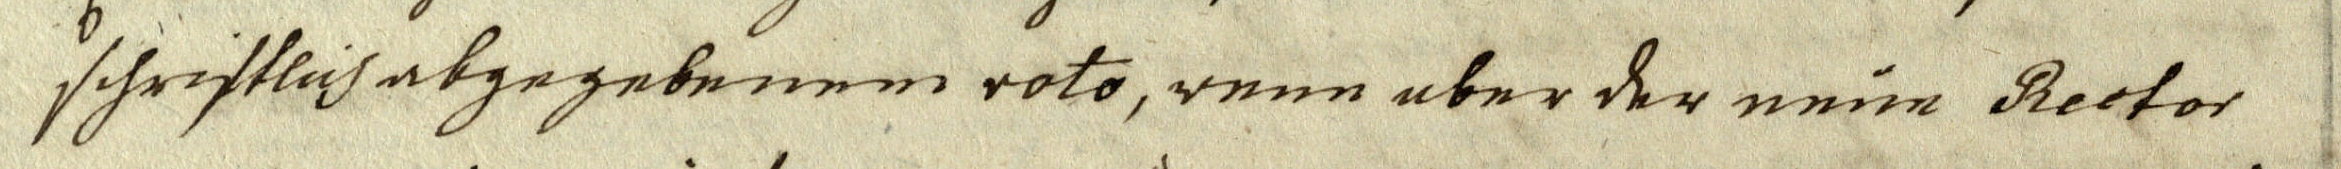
schriftlich abgegebenen voto, wenn aber der neue Rector
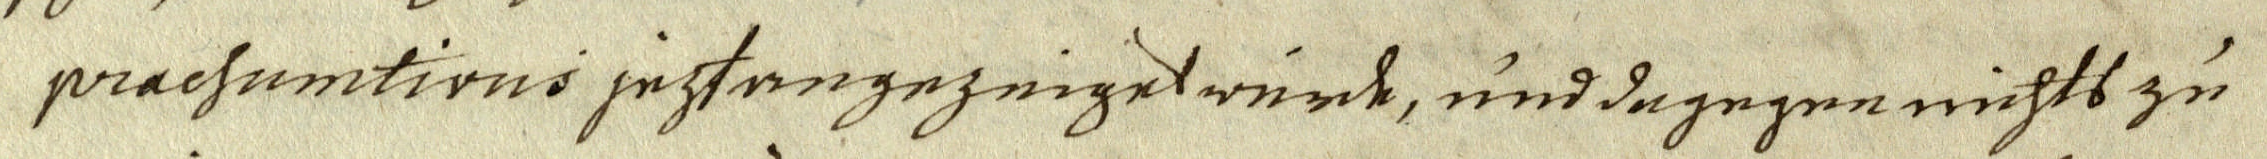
praesumtivus jezt angezeiget würde, und dagegen nichts zu
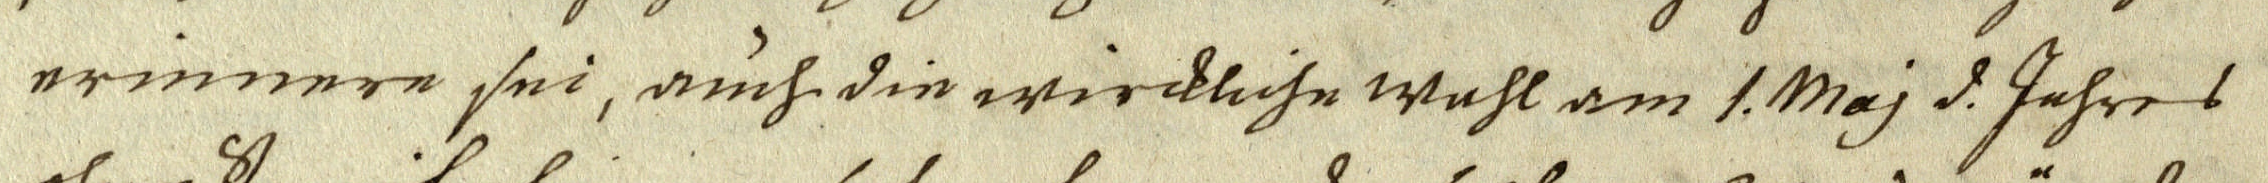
erinnern sei, auch die wirckliche Wahl am 1. Mai d. Jahres
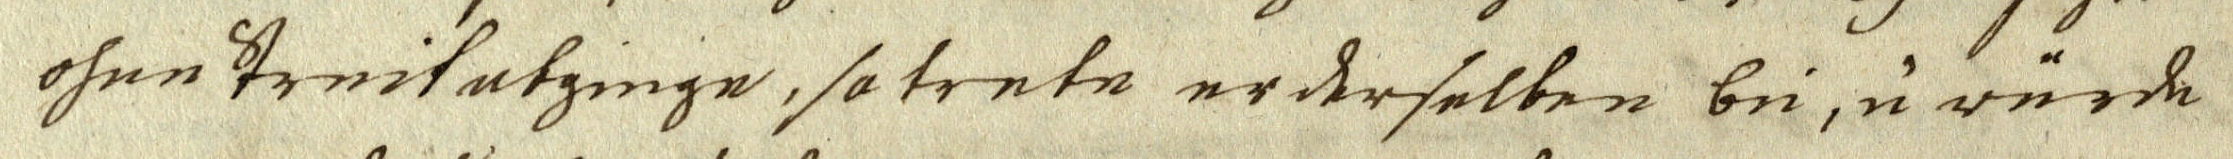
ohne Streit abginge, so trete er derselben bei, u würde
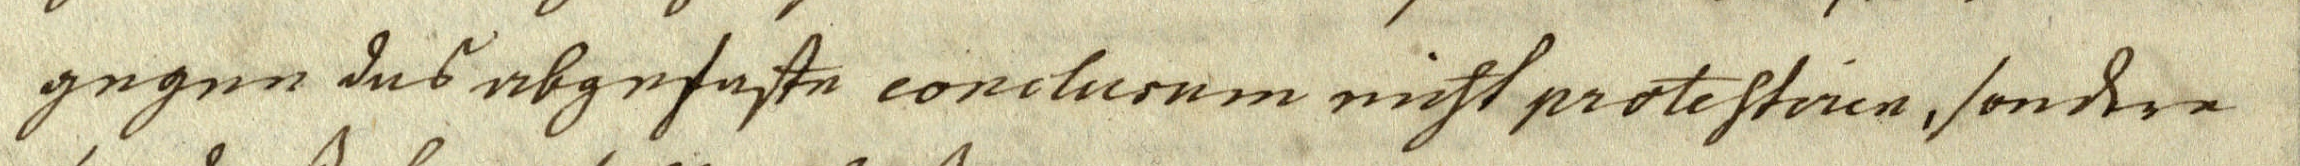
gegen das abgefaste conclusum nicht protestiren, sondern
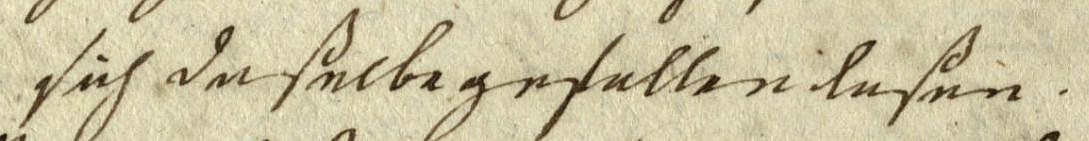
sich daßelbe gefallen laßen.
